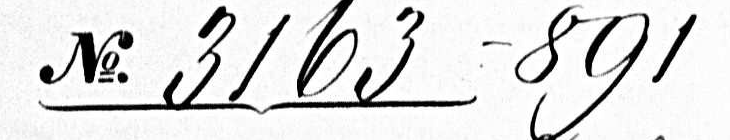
No. 3163 - 1891
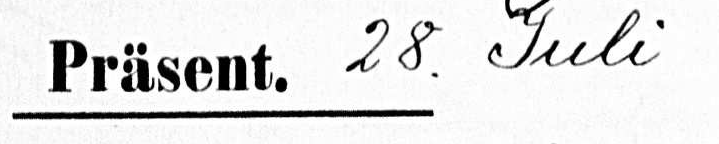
Präsent. 28. Juli
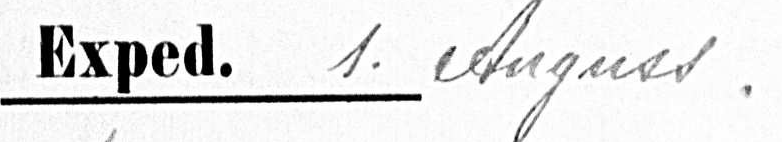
Exped. 1. August
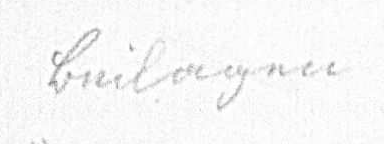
Beilagen
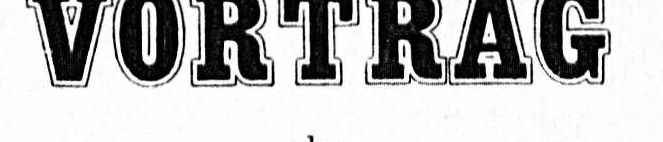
VORTRAG
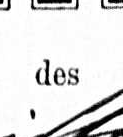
des
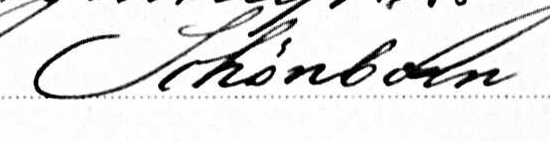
Schönborn
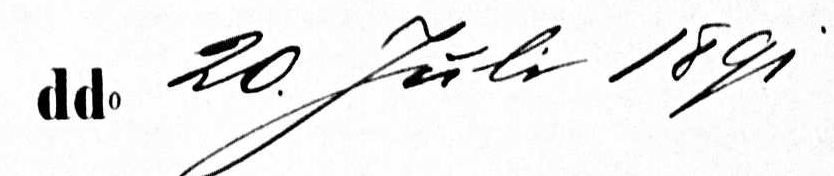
ddo 20. Juli 1891
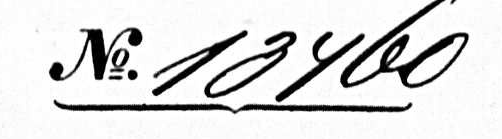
No. 13460
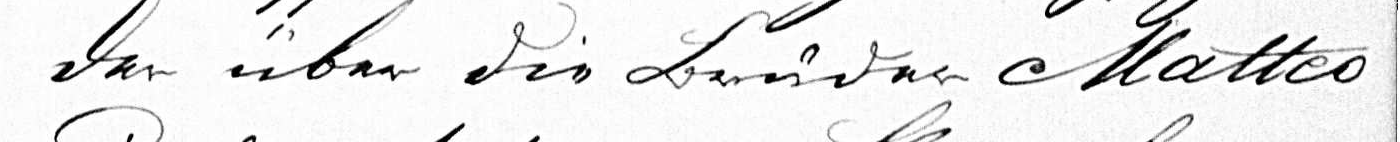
der über die Brüder Matteo
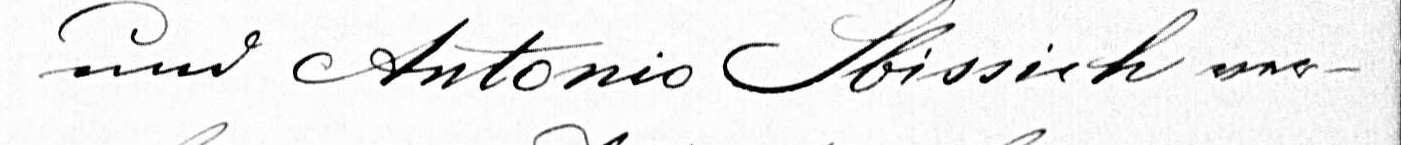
und Antonio Sbissich ver¬
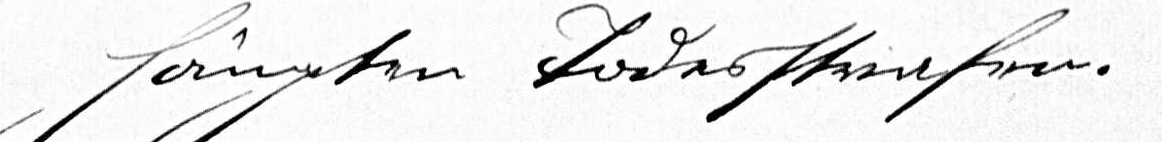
hängten Todesstrafen.
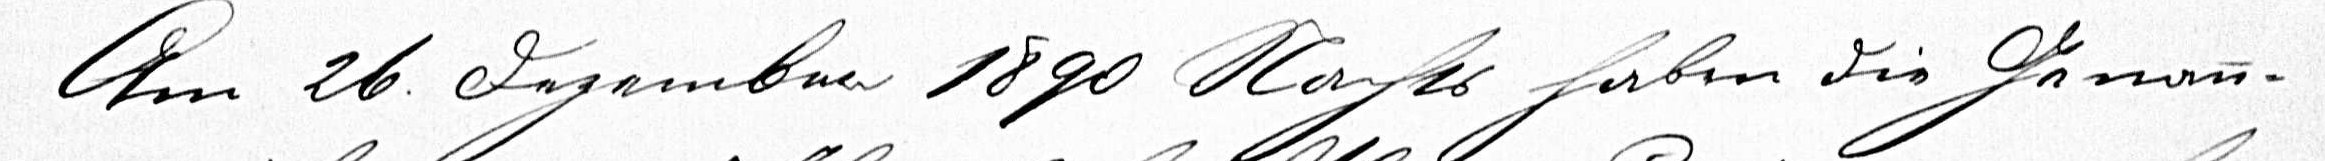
Am 26. Dezember 1890 Nachts haben die Genann¬
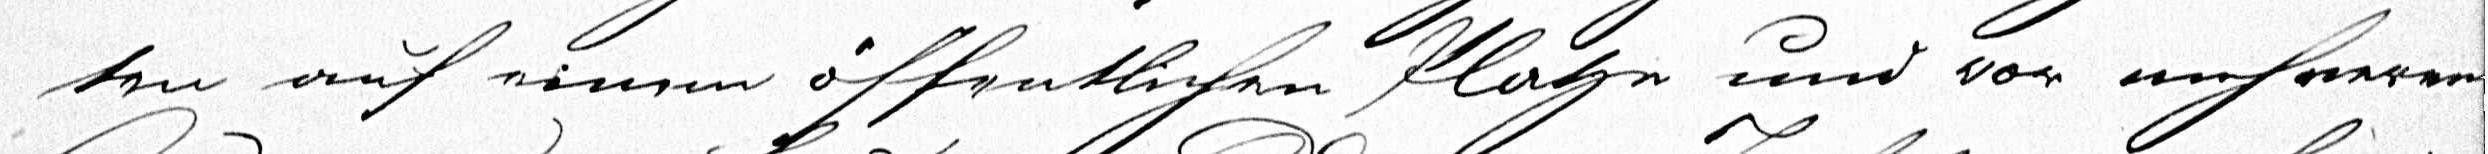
ten auf einen öffentlichen Platze und vor mehreren
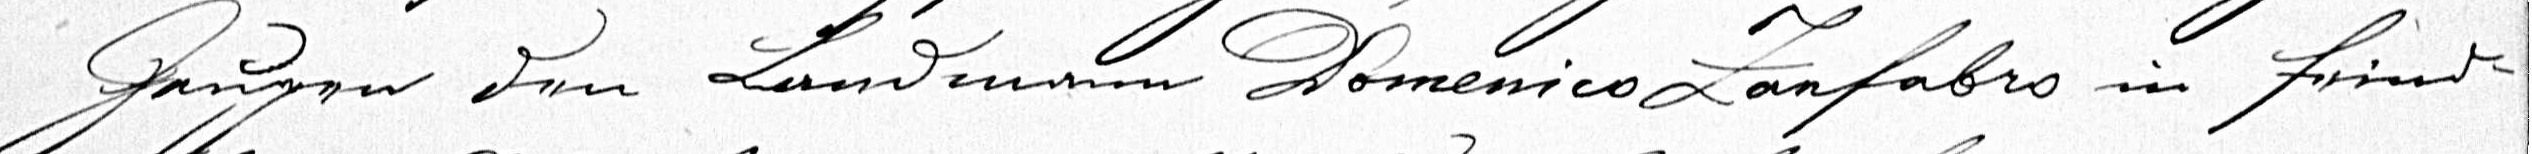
Zeugen den Landmann Domenico Zanfabro in feind¬
